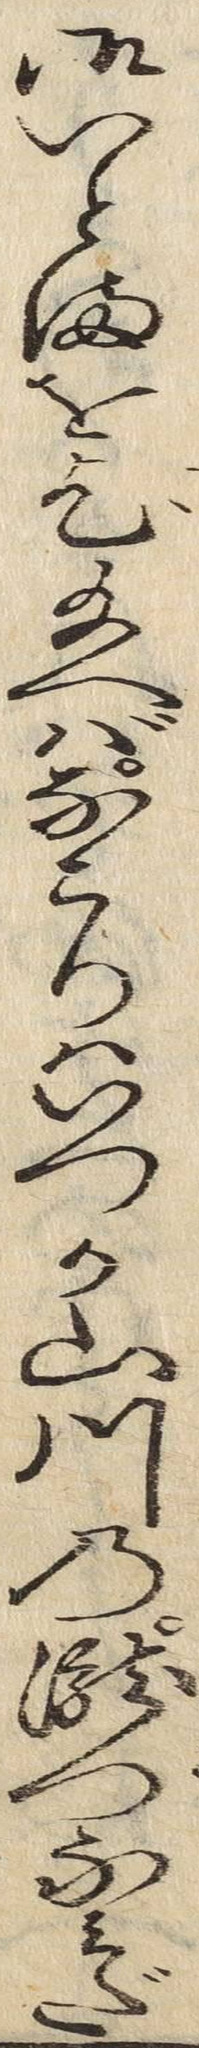御いとまを乞給へば。なこりはいつか山川の滝つなみだ
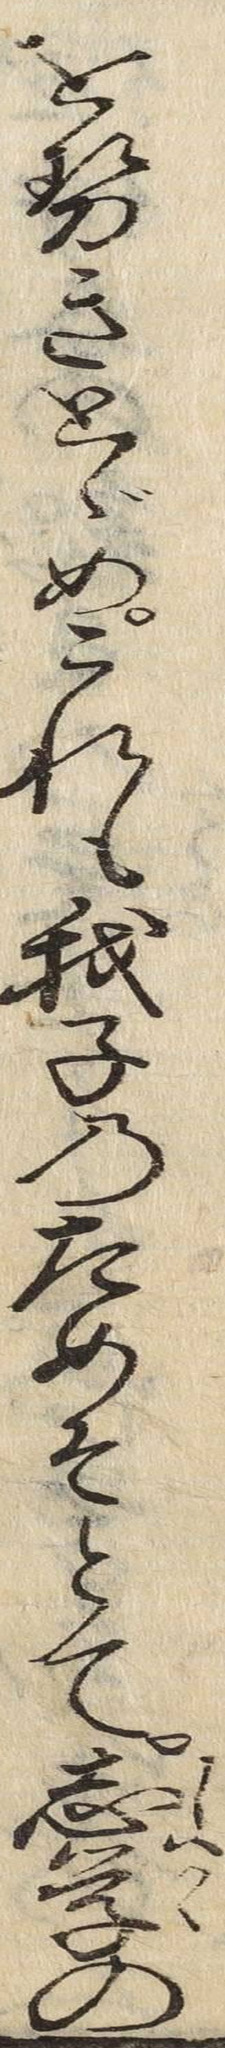をせきとゞめ。これも我子のためそととて志学の
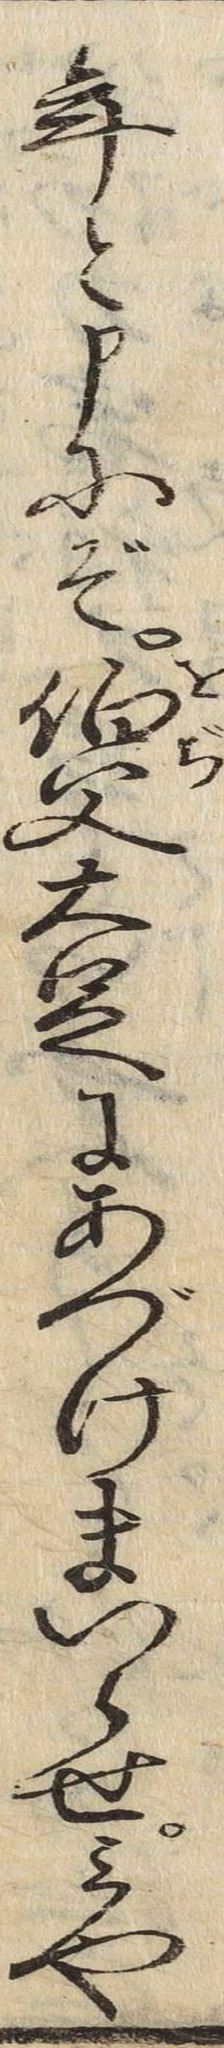年と申にぞ。伯父大足にあづけまいらせ。みや
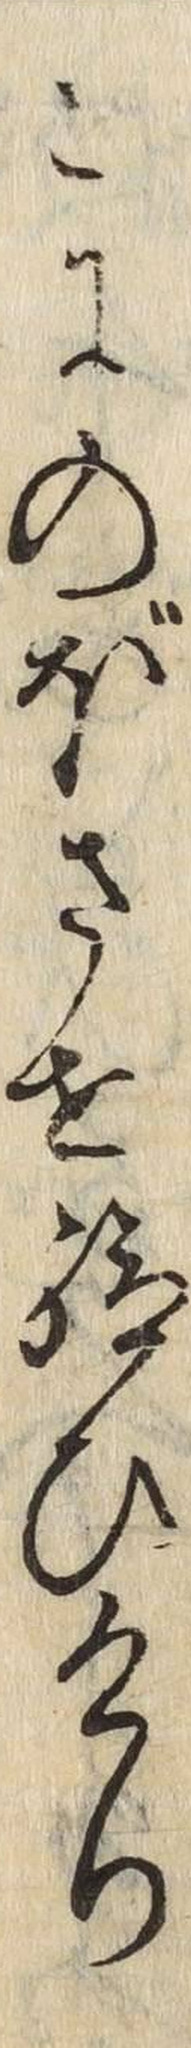こにのぼさせ給ひけり

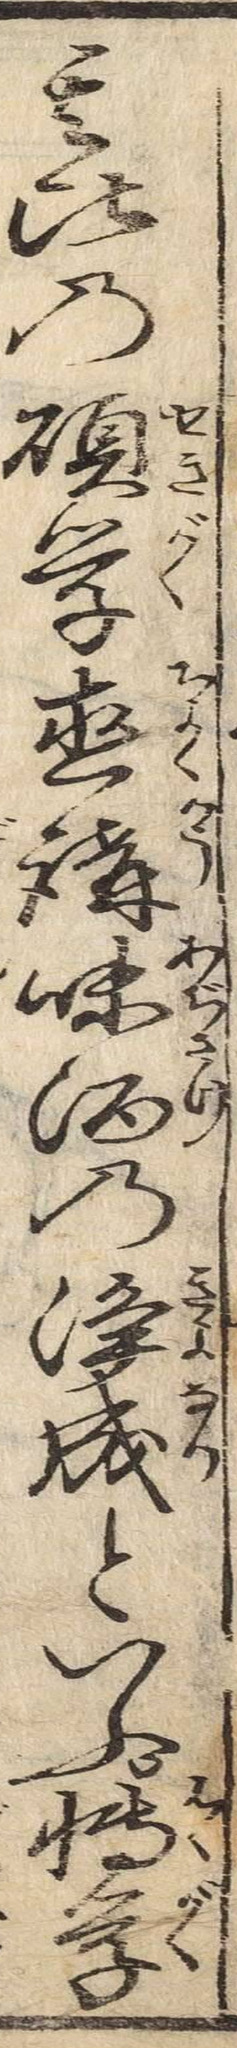其頃の碩学直講味酒の浄成といふ。博学
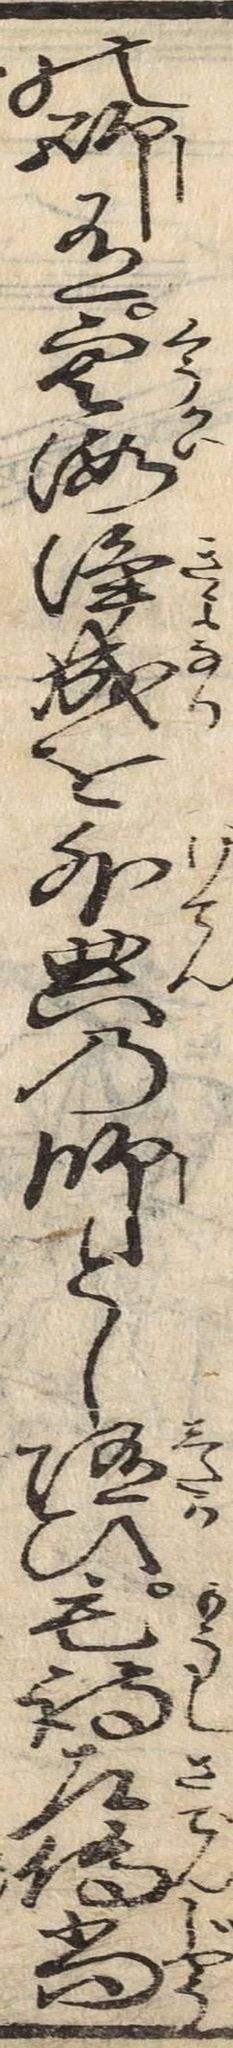の師有。空海浄成を外典の師とし随ひ。毛詩左伝尚
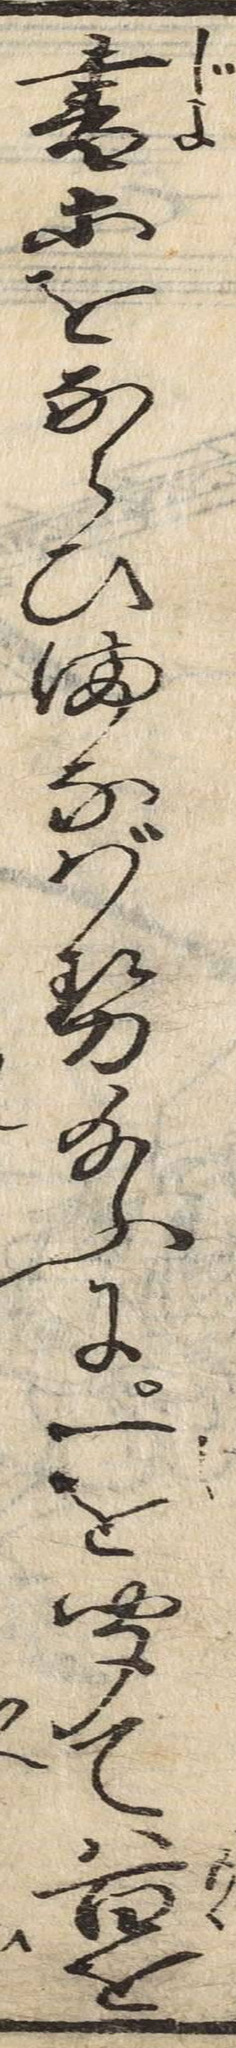書等をならひまなばせ給ふに。一を聞ては百を
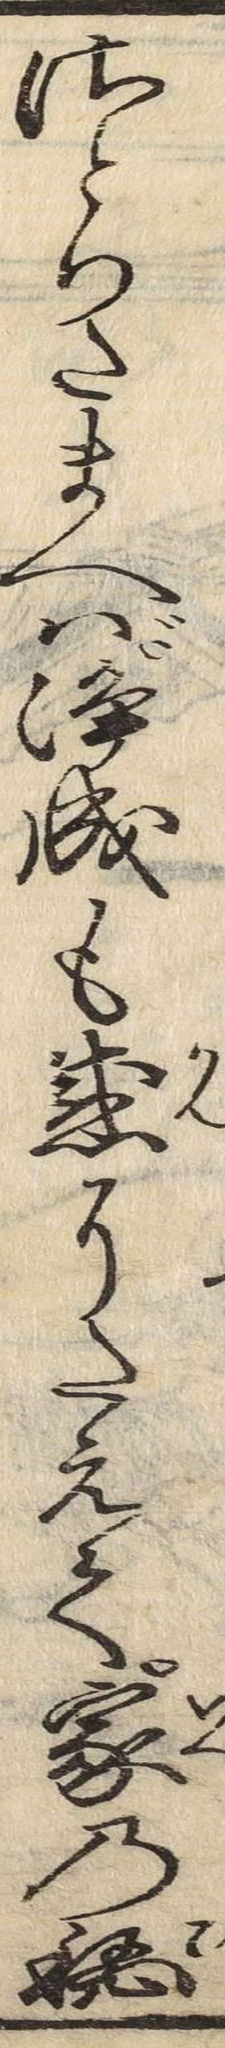さとりたまへは。浄成も感にたえて。家の秘
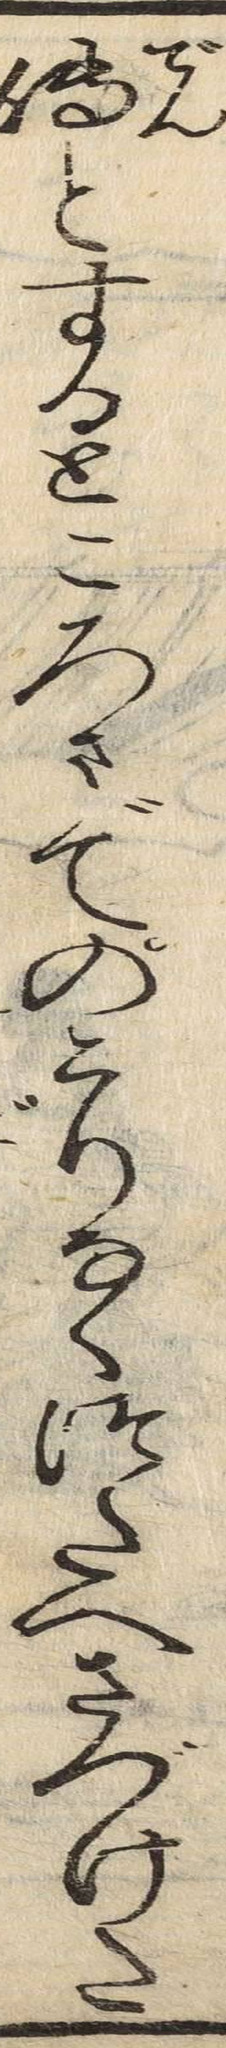伝とするところまでのこりなくつたへさづけた
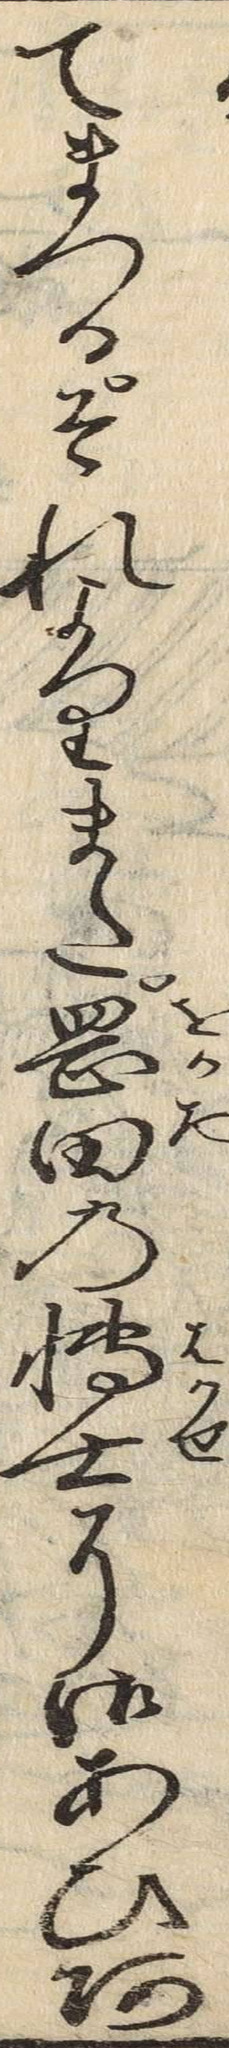てまつる。それよりまた。岡田の博士に御あひあ
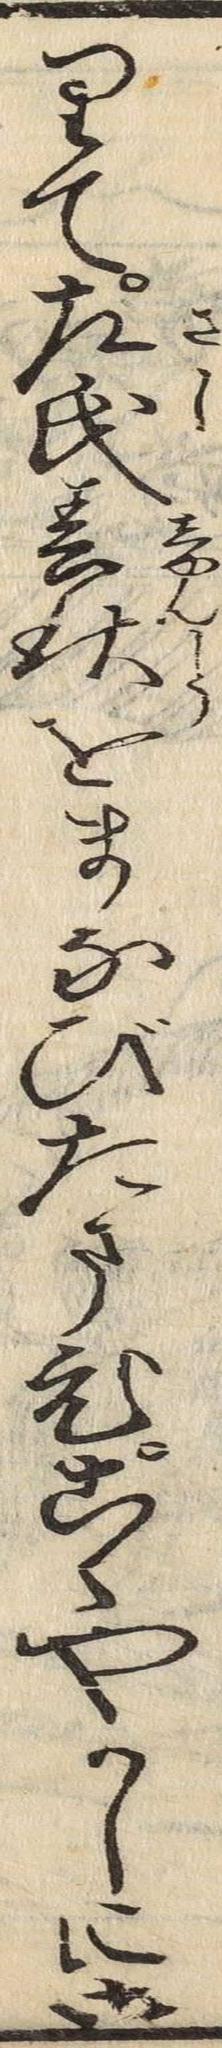りて。左氏春秋をまなびたまひ。こゝやかしこと
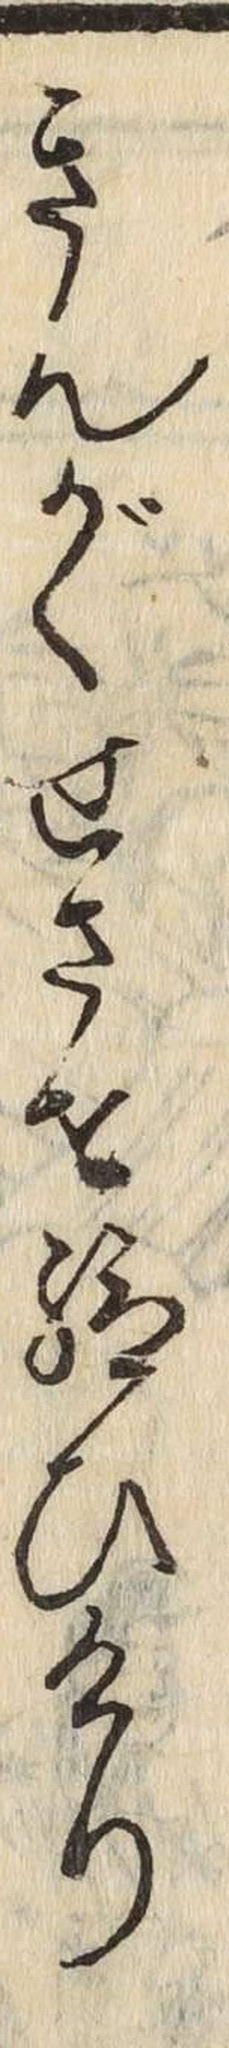きんがくせさせ給ひけり

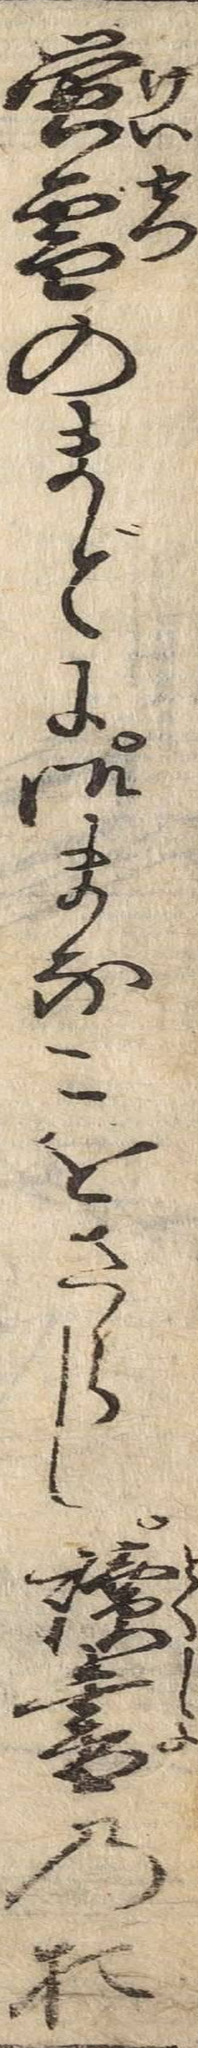蛍雪のまとに。御まなこをさらし。読書のお
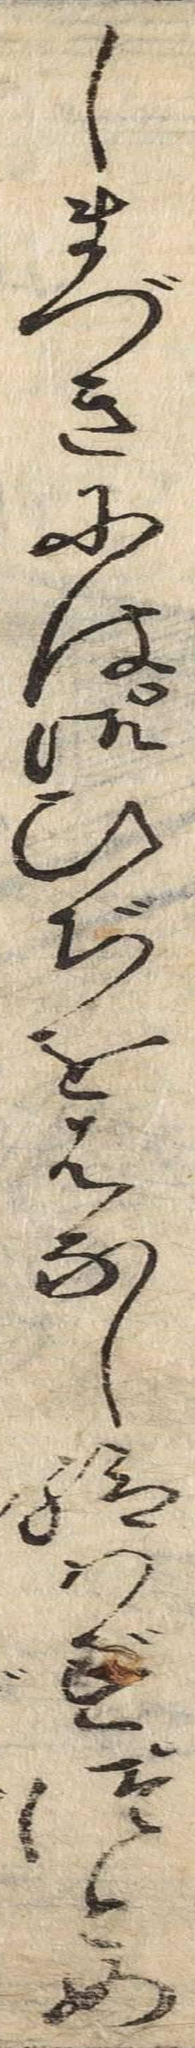しまづきには。御ひぢをはなし給はず。つとめつとめ
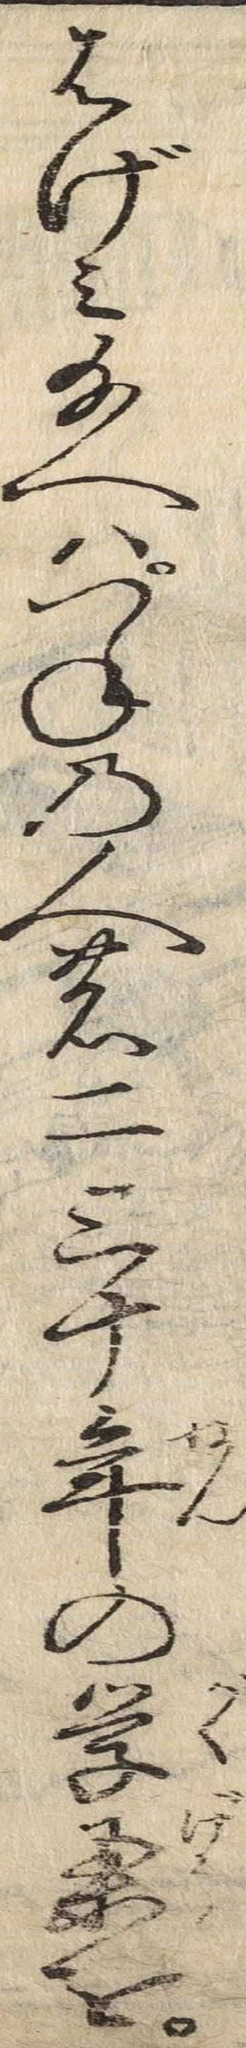はげみ給へは。つねの人の二三十年の学業を。
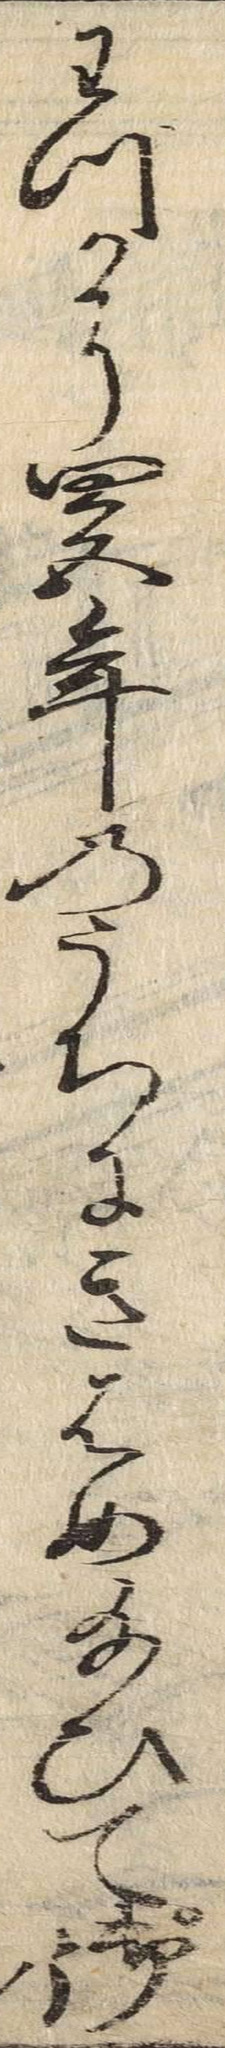わつかに四五年のうちにきはめ給ひて。御
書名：弘法大師御傳記
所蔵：京都府立京都学・歴彩館 国文学研究資料館
